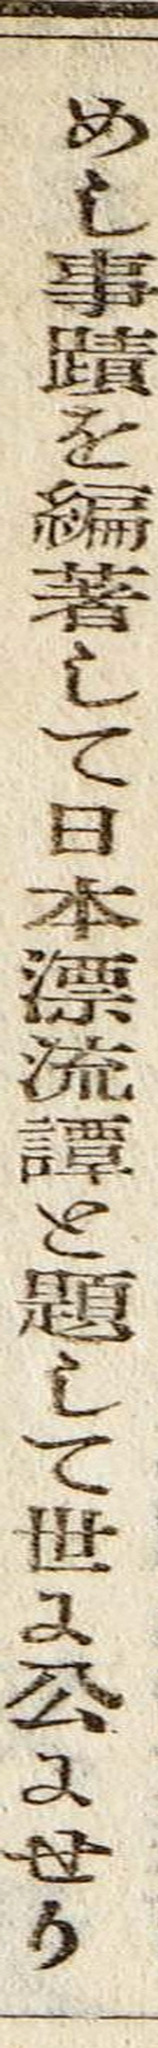めし事蹟を編著して日本漂流譚と題して世に公にせり
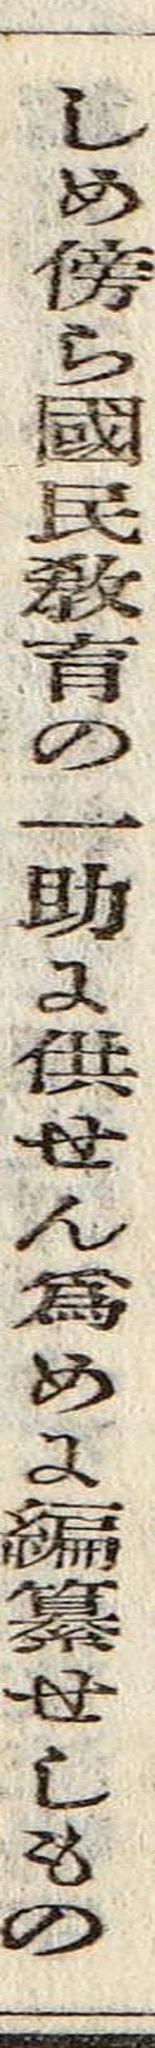しめ傍ら国民教育の一助に供せん為めに編纂せしもの
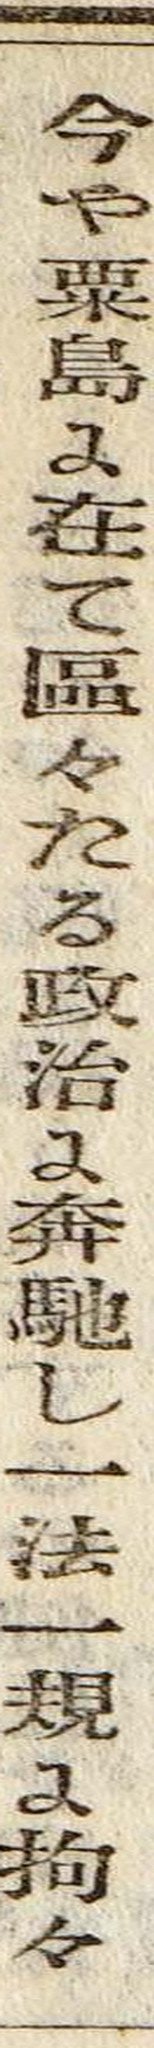今や粟島に在て区々たる政治に奔馳し一法一規に拘々
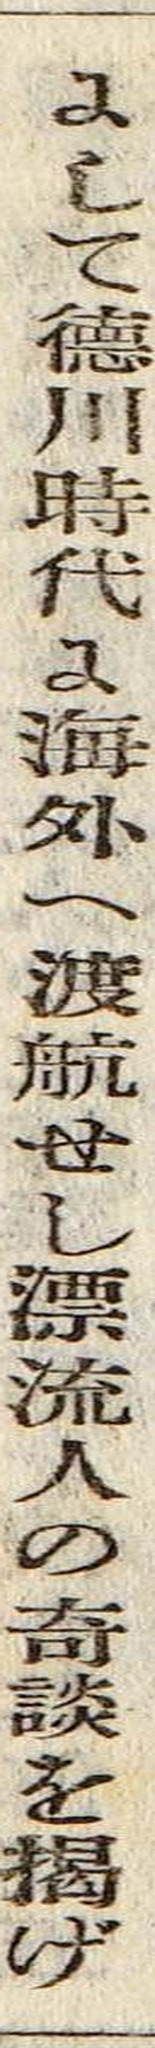にして徳川時代に海外へ渡航せし漂流人の奇談を掲げ
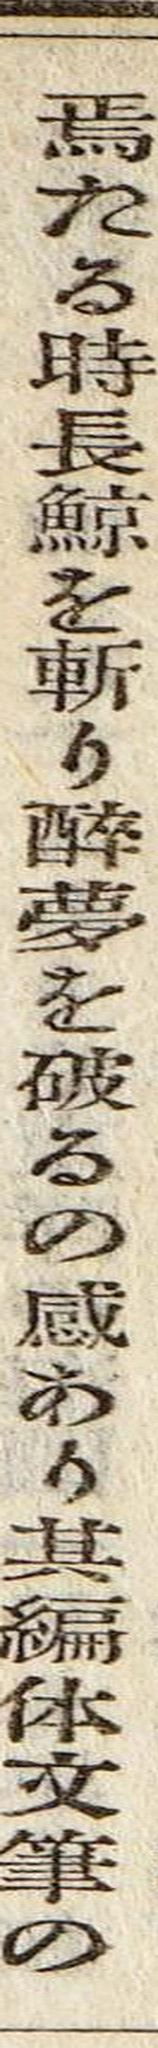焉たる時長鯨を斬り醉夢を破るの感あり其編体文筆の
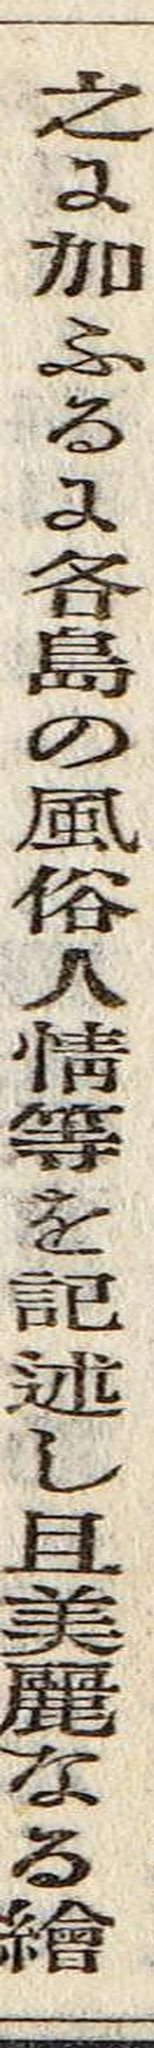之に加ふるに各島の風俗人情等を記述し且美麗なる絵
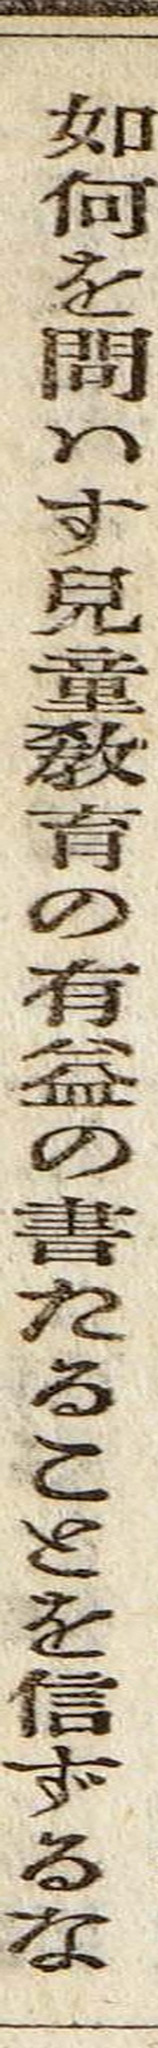如何を問はす児童教育の有益の書たることを信ずるな
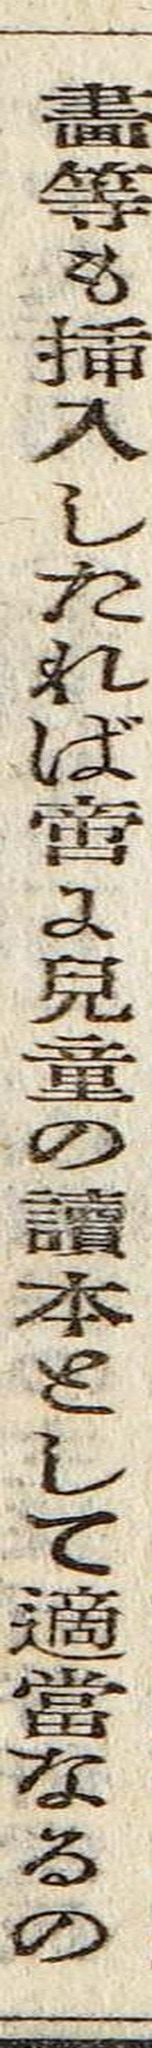画等も挿入したれば啻に児童の読本として適当なるの
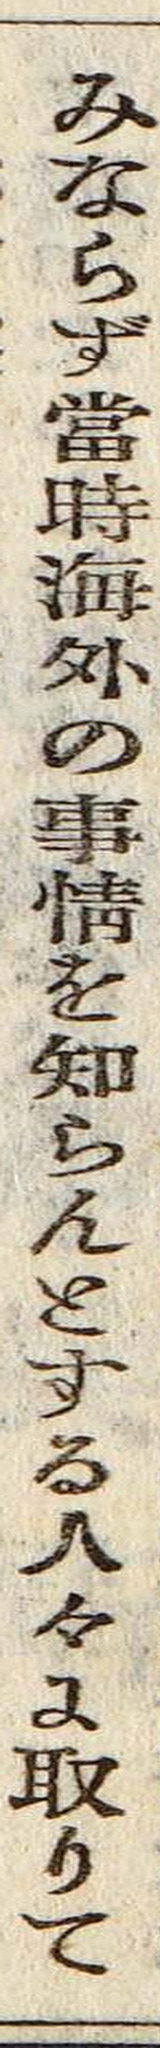みならず当時海外の事情を知らんとする人々に取りて
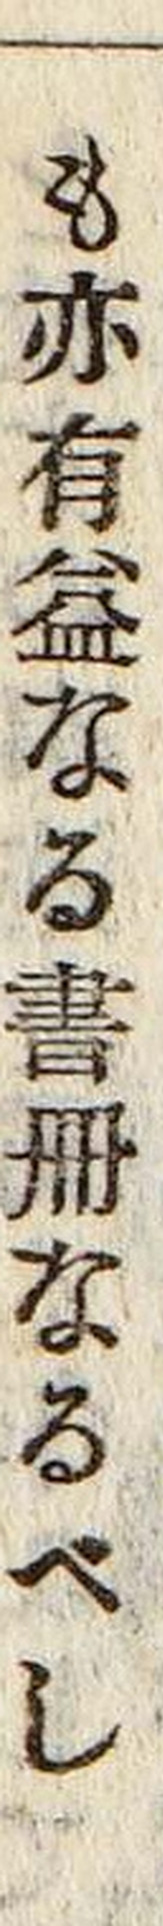も亦有益なる書冊なるべし
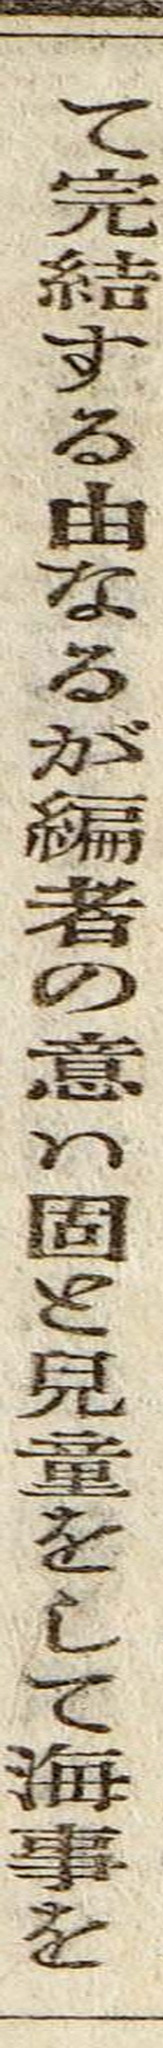て完結する由なるが編者の意は固と児童をして海事を
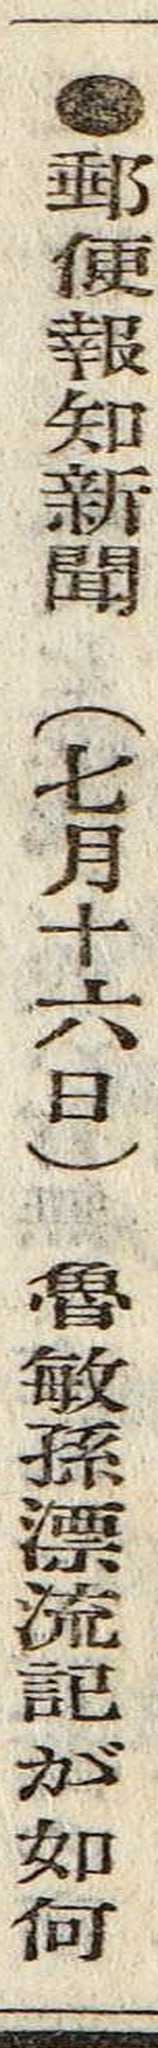●郵便報知新聞(七月十六日)魯敏孫漂流記が如何

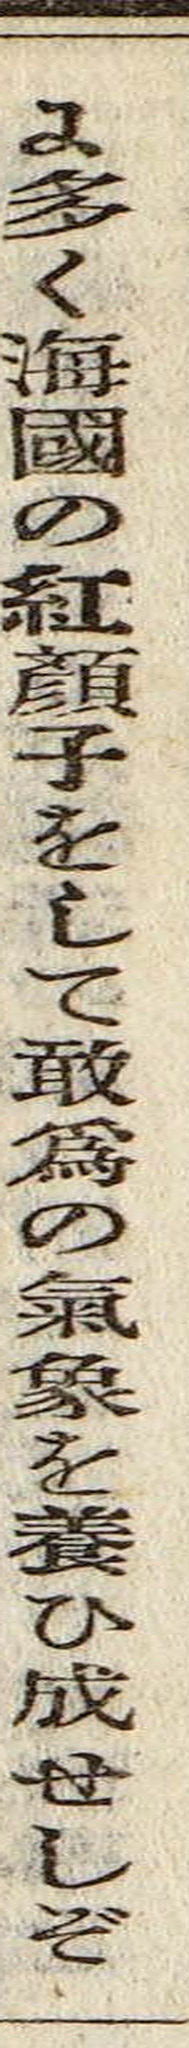に多く海国の紅顔子をして敢為の気象を養ひ成せしぞ
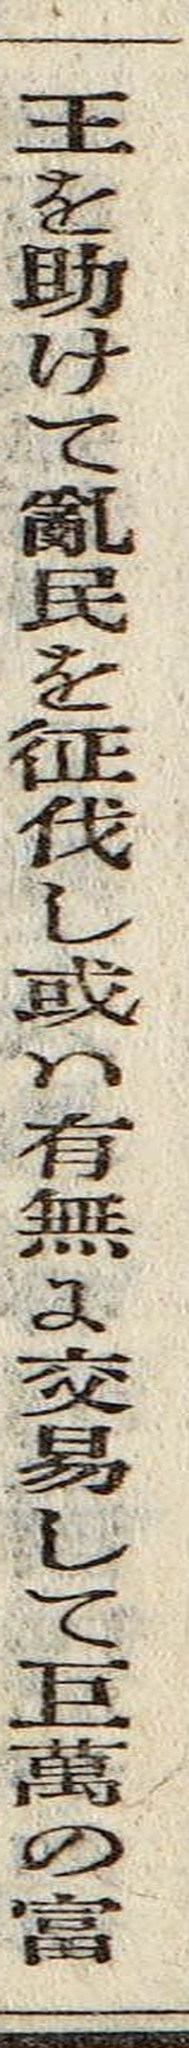王を助けて亂民を征伐し或は有無に交易して巨萬の富
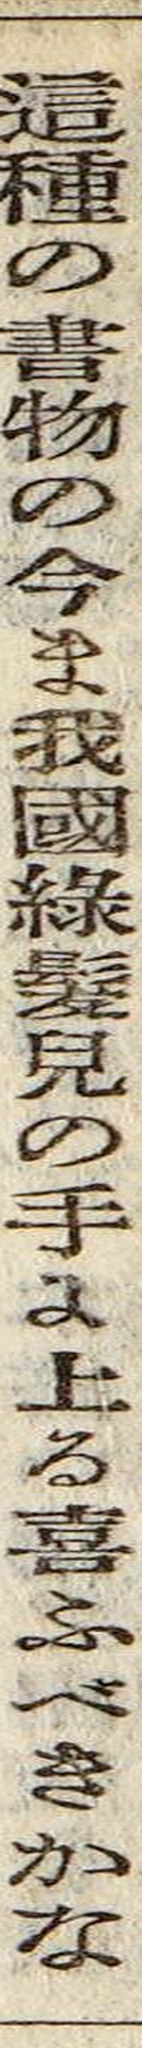這種の書物の今ま我国縁髪児の手に上る喜ふべきかな
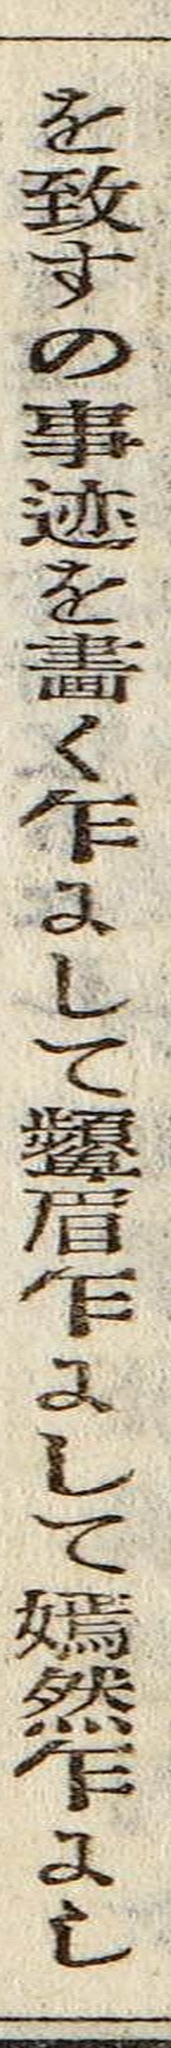を致すの事迹を畵く乍にして顰眉乍にして嫣然乍にし
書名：日本漂流譚
